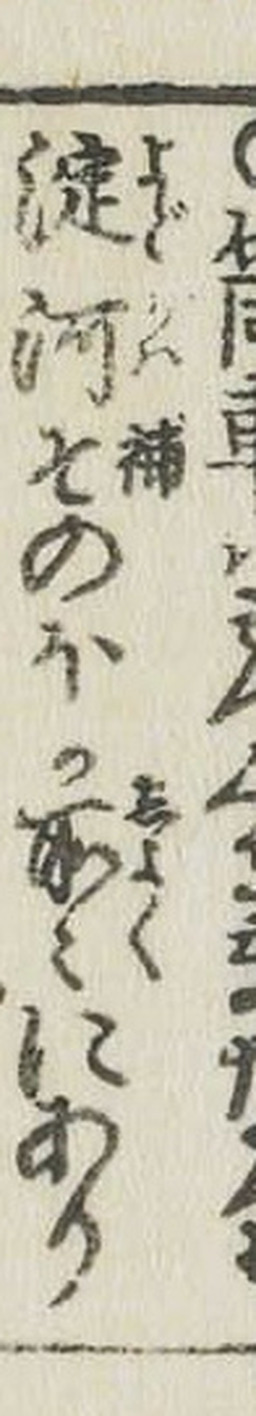淀河そのほか所々にあり
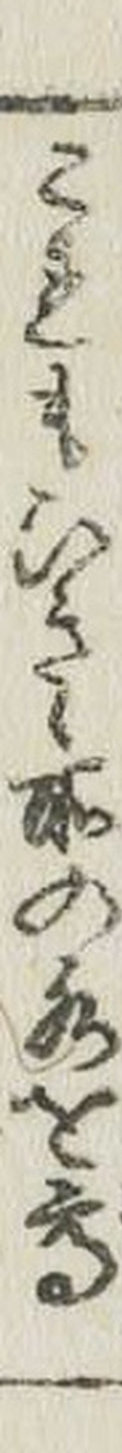これもひきく所の水を高
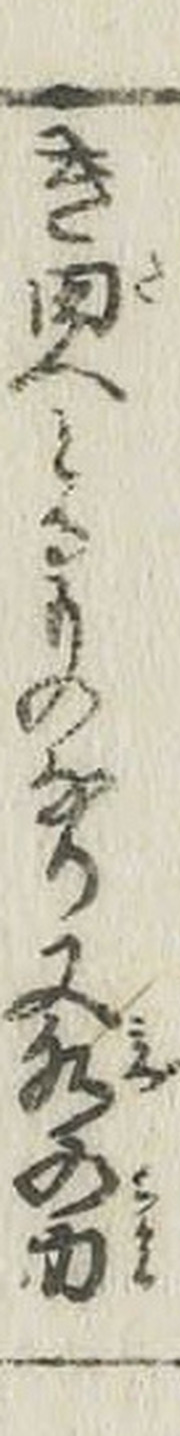き田へとるものなり又水の力
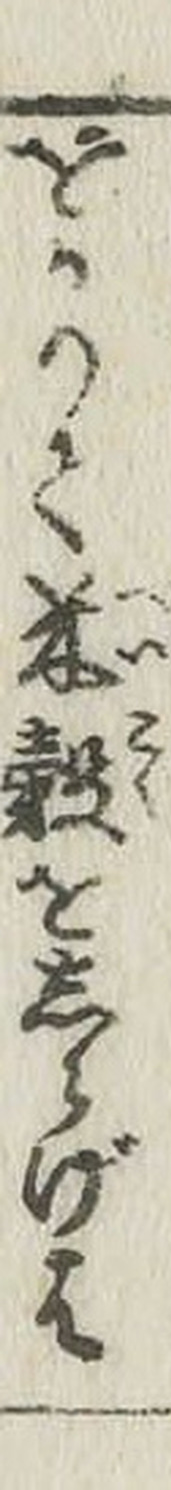をかりて米穀をしらげは
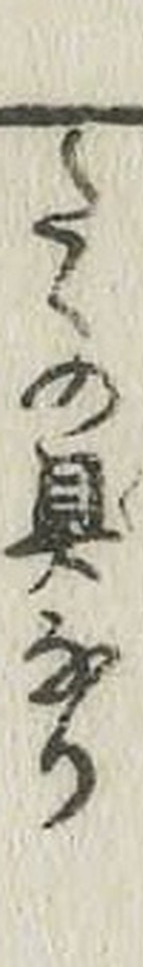たくの具なり
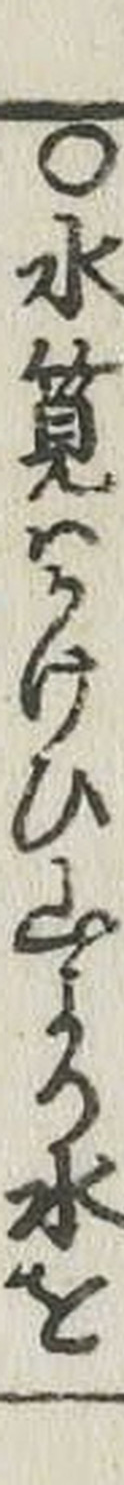○水筧はかけひ山より水を
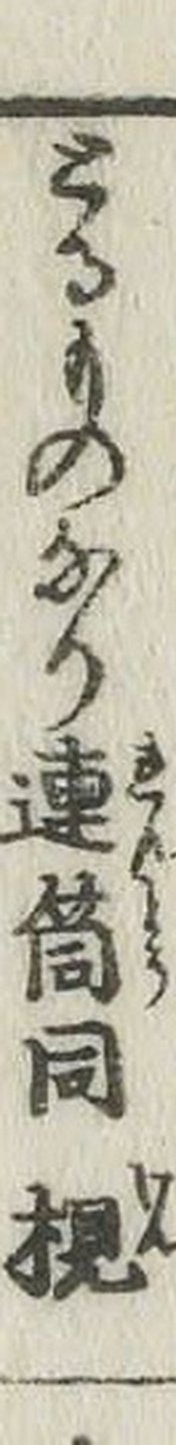とるものなり連筒同梘
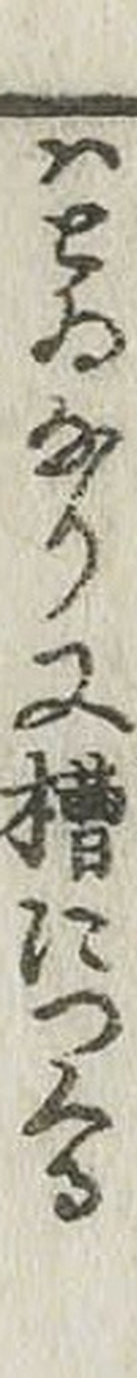はとゐなり又槽につくる
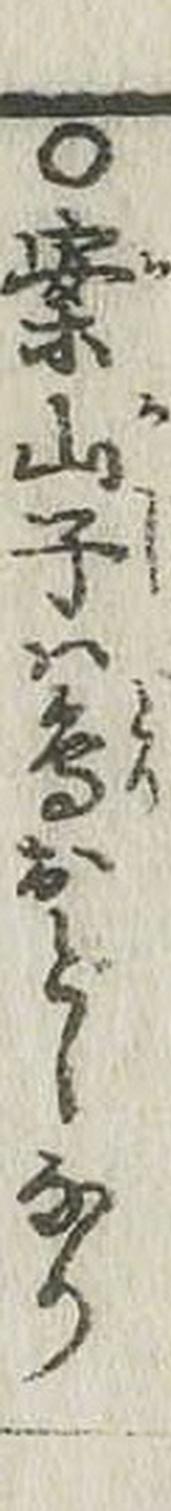○案山子は鳥おどしなり
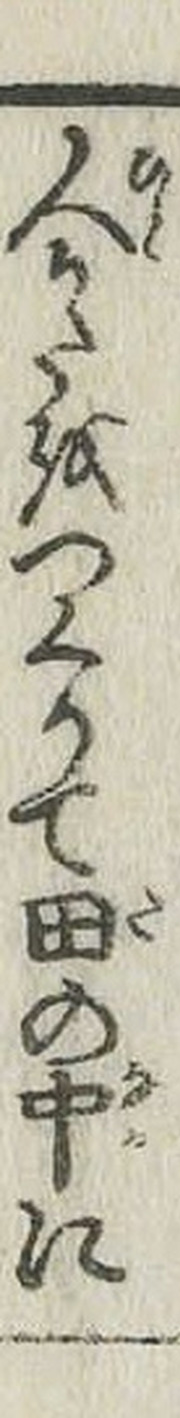人かたをつくりて田の中に
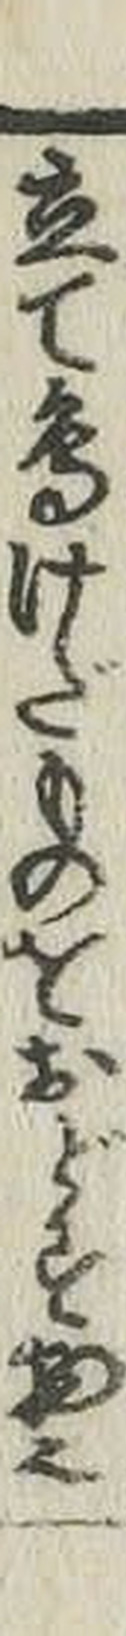立て鳥けだものをおどす物也

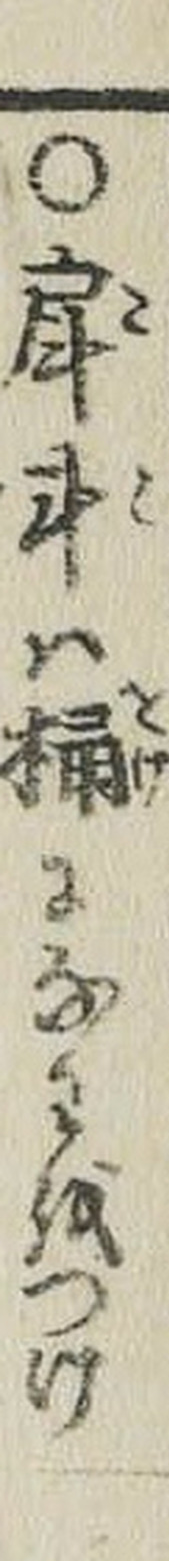○戽斗は桶になわをつけ
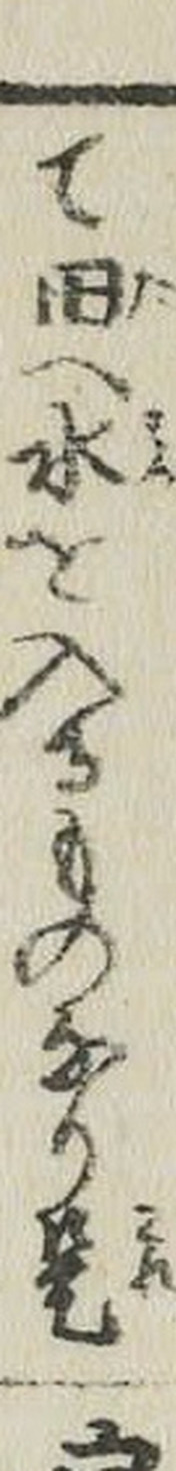て田へ水を入るものなり是
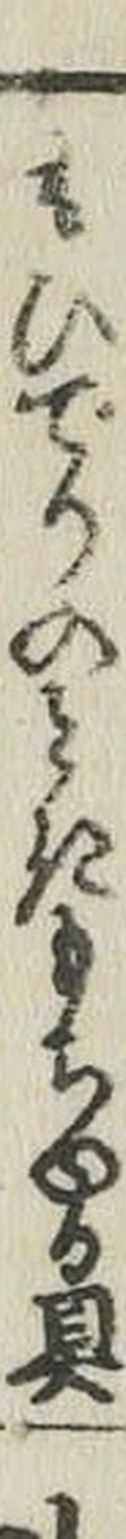もひでりのときもちゆる具
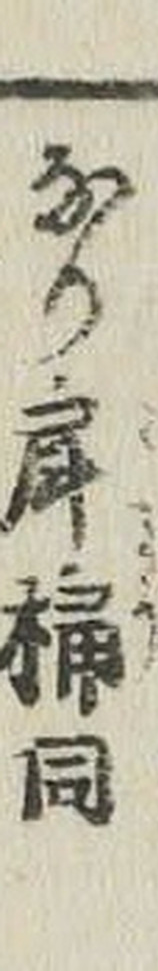なり戽桶同
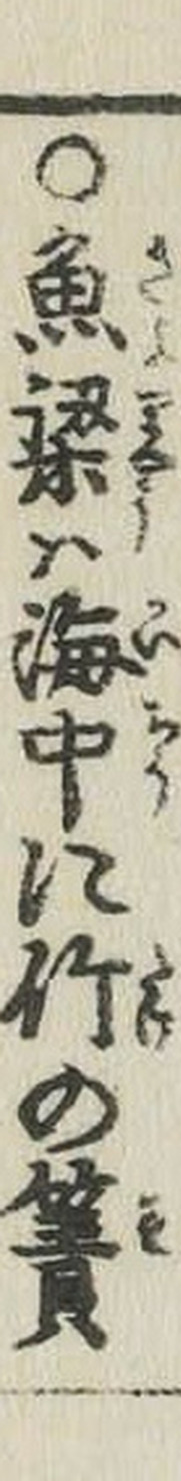○魚梁は海中に竹の簀
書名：増補頭書訓蒙図彙大成 10巻 5:巻之9-11
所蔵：東京学芸大学教育コンテンツアーカイブ
